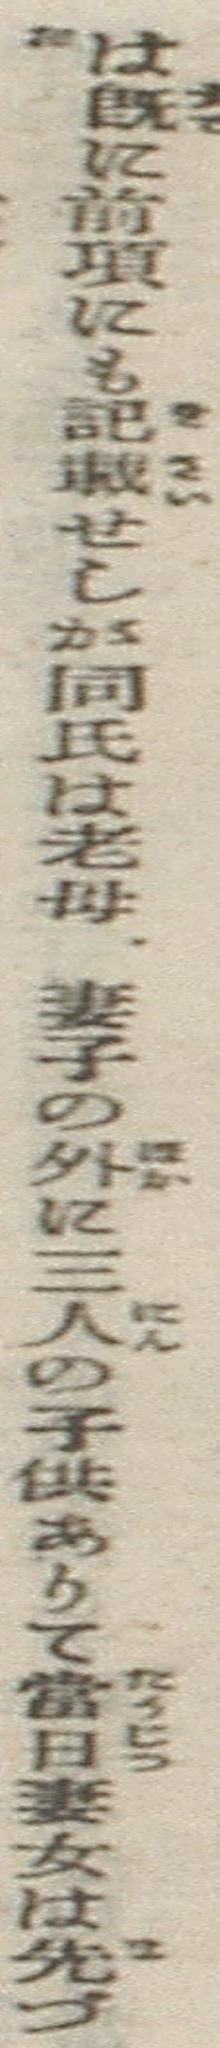は既に前項にも記載せしが同氏は老母、妻子の外に三人の子供ありて当日妻女は先づ
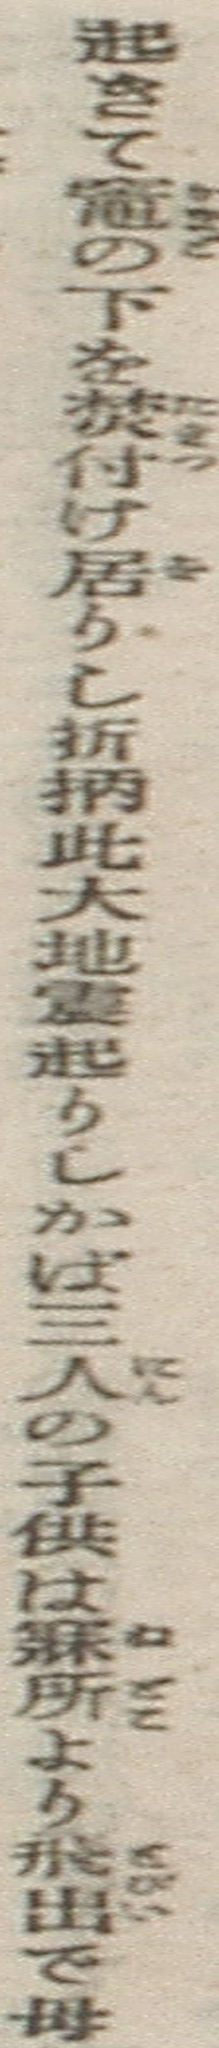起きて竃の下を焚付け居りし折柄此大地震起りしかば三人の子供は寝所より飛出で母
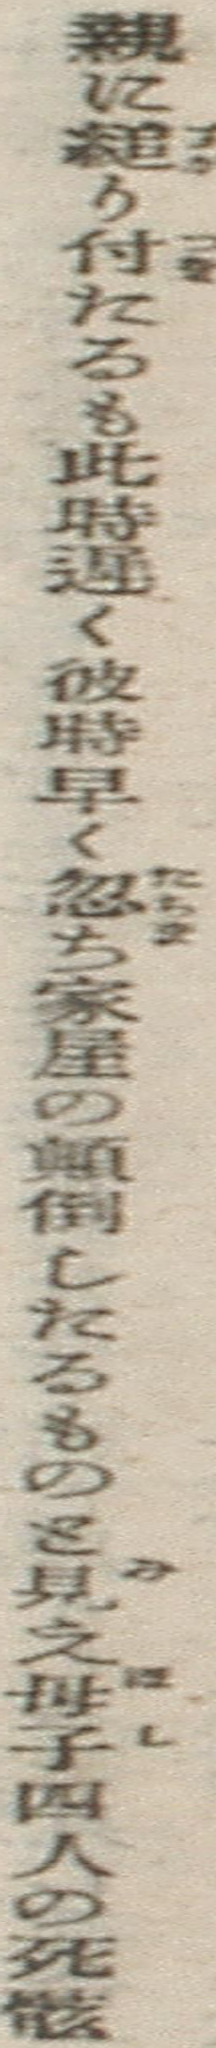親に縋り付たるも此時遅く彼時早く忽ち家屋の顛倒したるものと見え母子四人の死骸

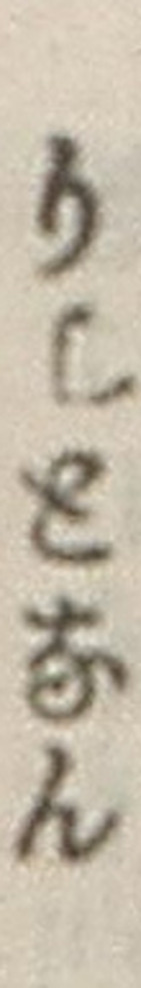りしとなん
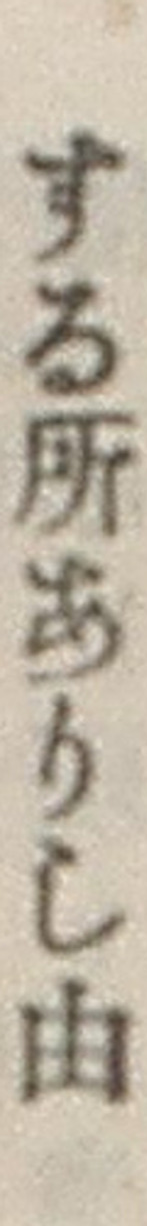する所ありし由
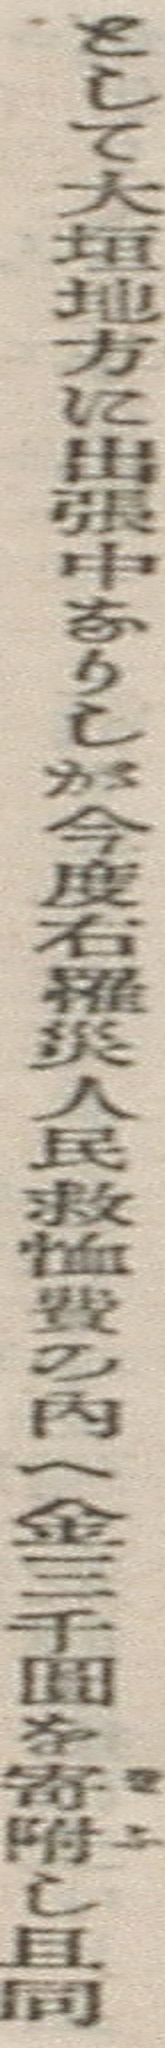として大垣地方ちはうに出張中なりしが今度右罹災人救恤費の内へ三千円を寄附きふし且同

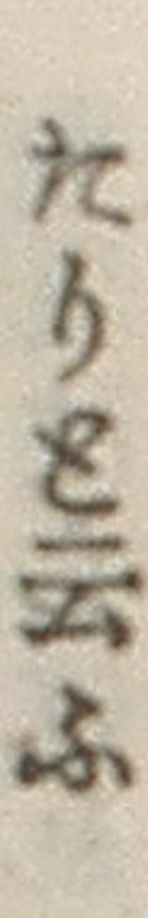たりと云ふ

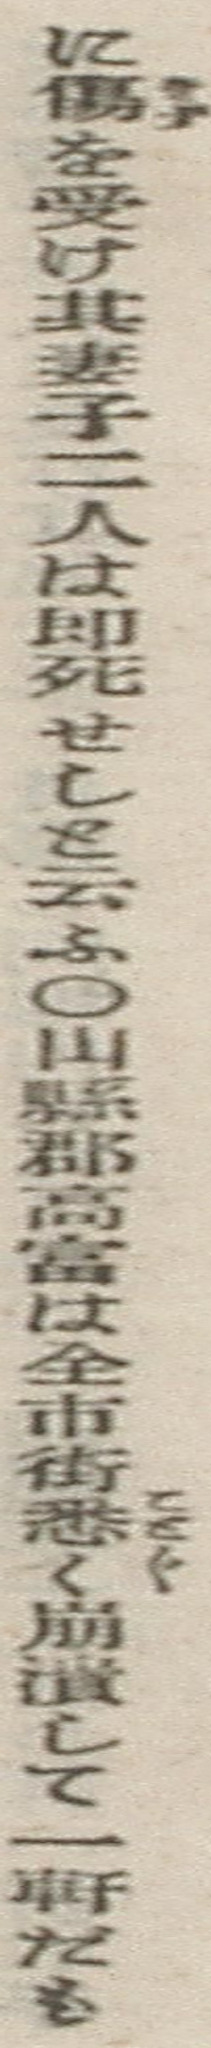に傷を受け其妻子二人は即死せしと云ふ○山県郡高富は全市街悉く崩潰して一軒だも
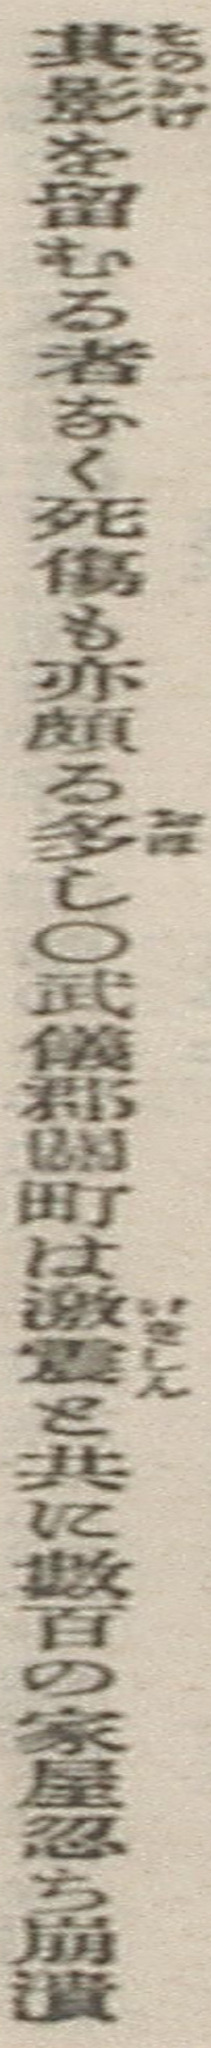其影を留むる者なく死傷も亦頗る多し○武儀郡関町は激震と共に数百の家屋忽ち崩潰
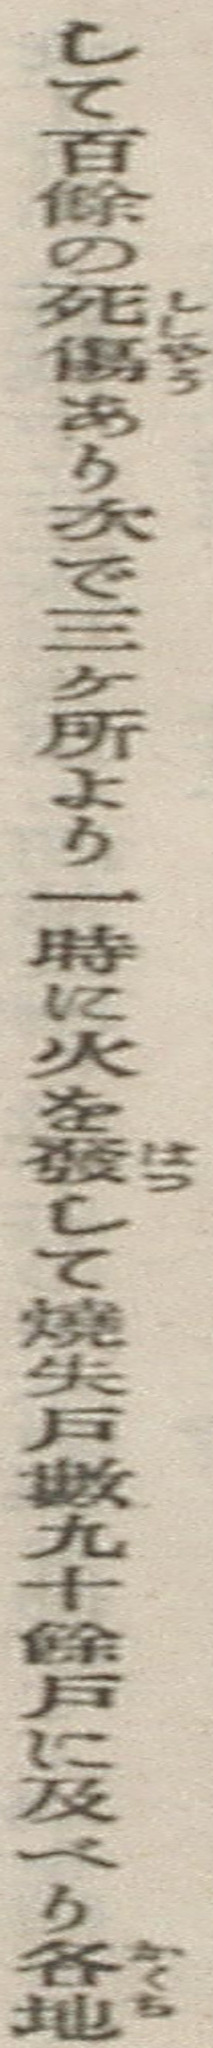して百余の死傷あり次で三ヶ所より一時に火を発して焼失戸数九十余戸に及べり各地
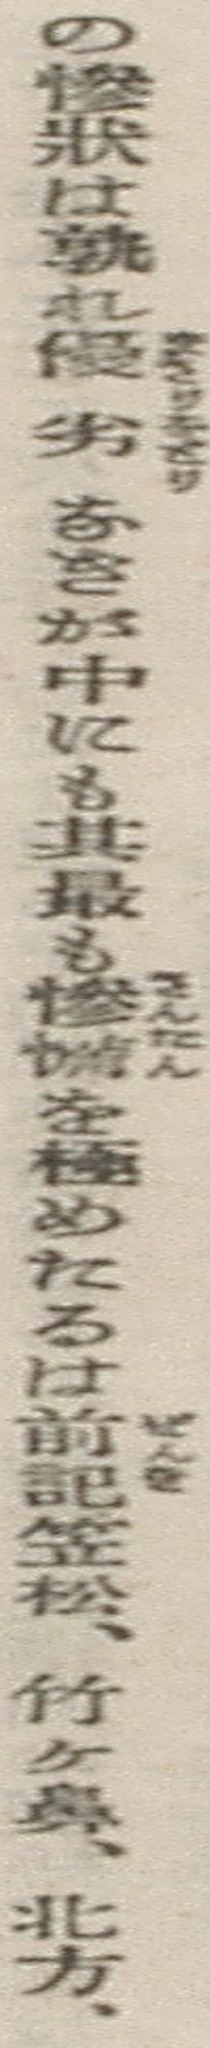の惨状は孰れ優劣なきが中にも其最も惨憺を極めたるは前記笠松、竹ケ鼻、北方、
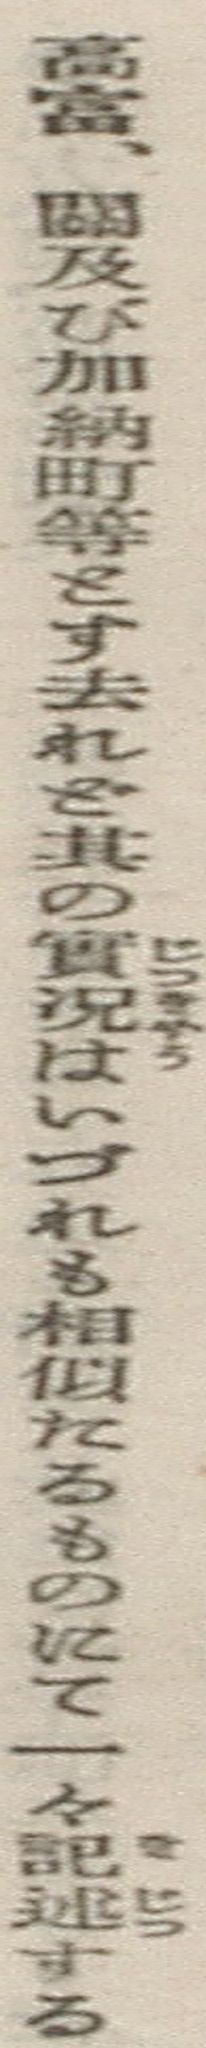高富、関及び加納町等とす去れど其の実況はいづれも相似たるものにて一々記述きじつする
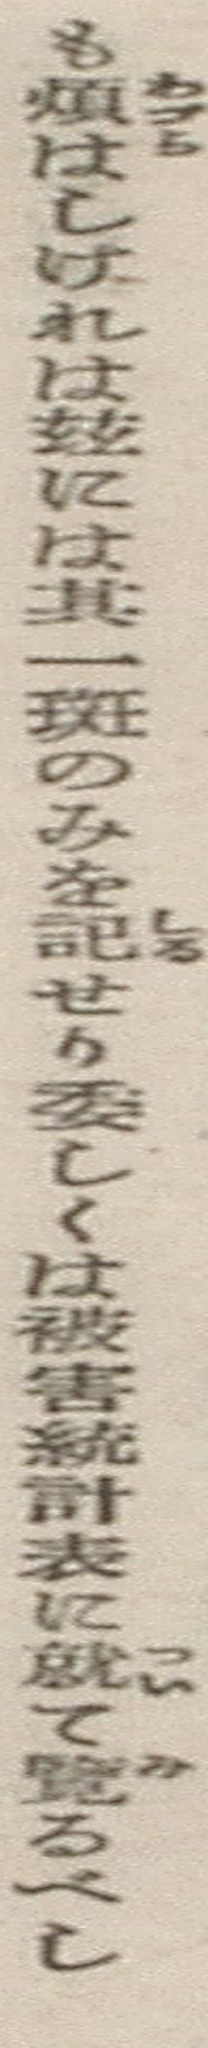も煩はしけれは玆には其一斑のみを記せり委しくは被害統計表に就て覧るべし
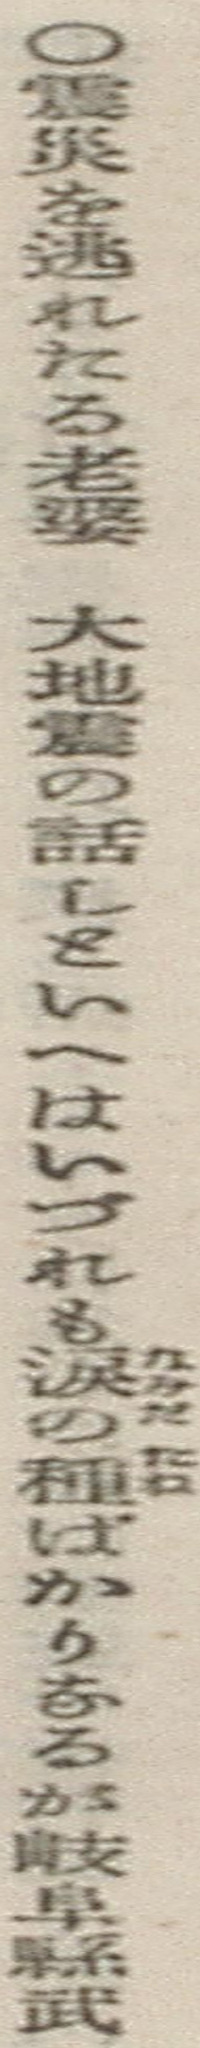○震災を逃れたる老婆大地震の話しといへはいづれも涙の種ばかりなるが岐阜県武
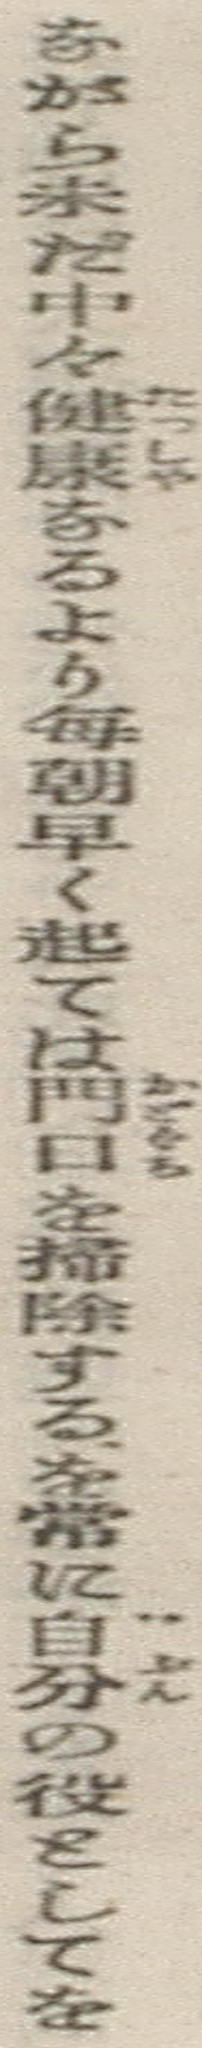ながら未だ中々健康たつしやなるより毎朝早く起ては門口を掃除するを常に自分の役としてを
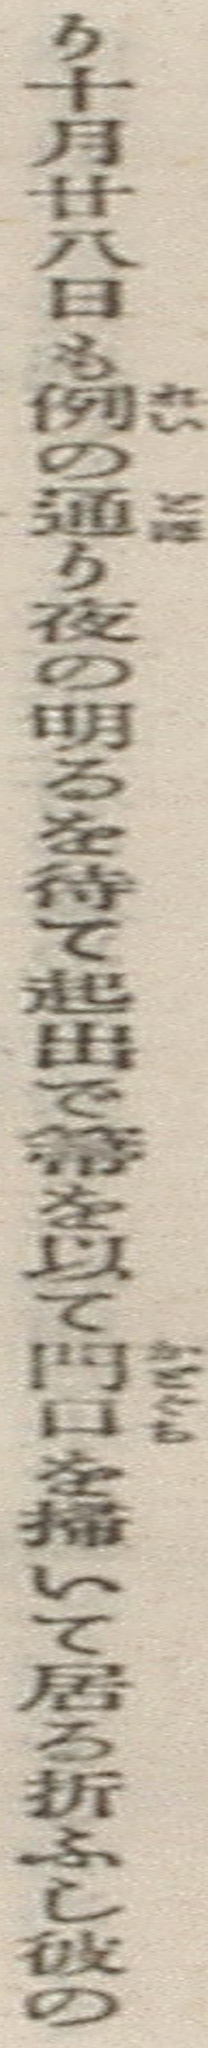り十月廿八日も例の通り夜の明るを待て起出で箒を以て門口を掃いて居る折ふし彼の
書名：愛知岐阜福井三県　大地震見聞録（内題）
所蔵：東京大学地震研究所図書室 Earthquake Research Institute Library, The University of Tokyo, JAPAN
